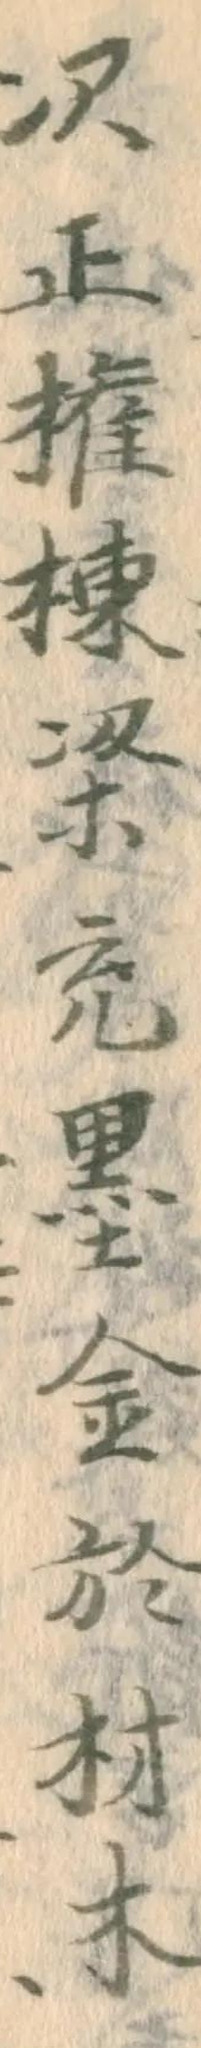次正権棟梁充墨金於材木
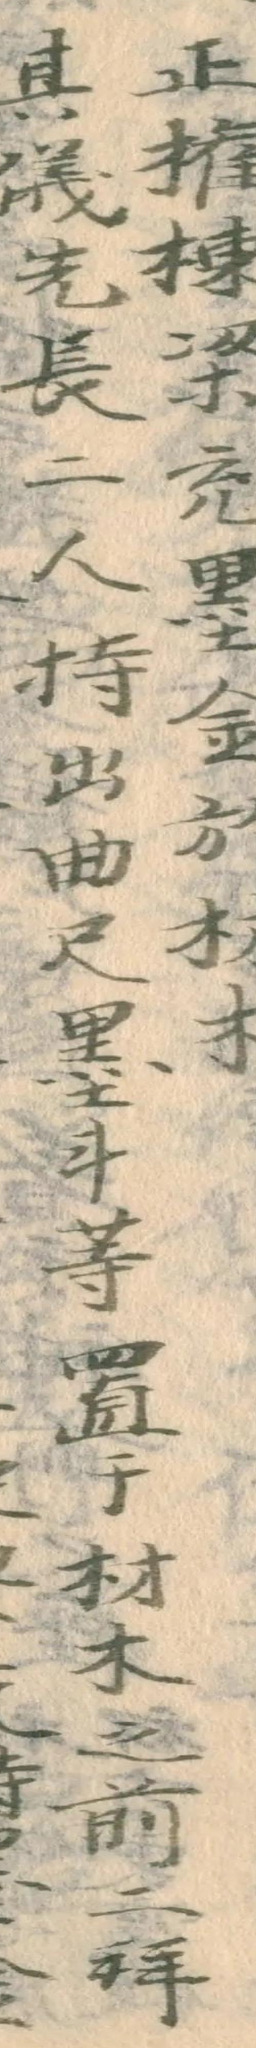其儀先長二人持出曲尺墨斗等置于材木之前二拝
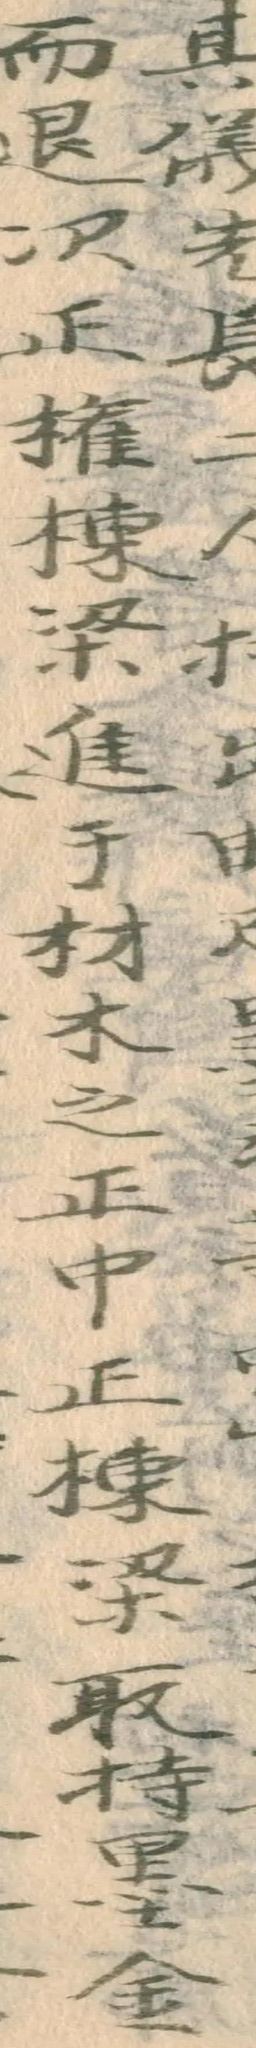而退次正権棟梁進于材木之正中正棟梁取持墨金
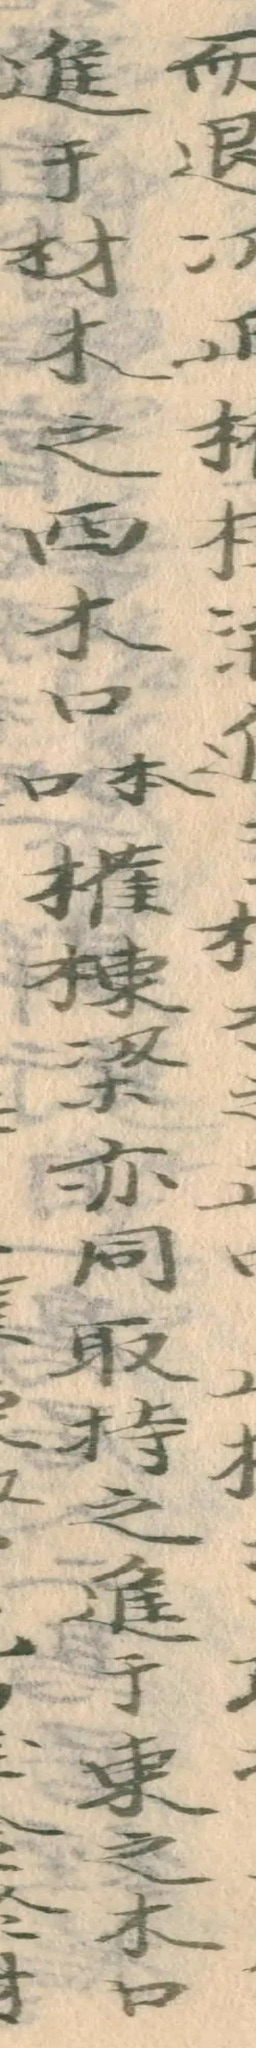進于材木之西木口本口権棟梁亦同取持之進于東之木口
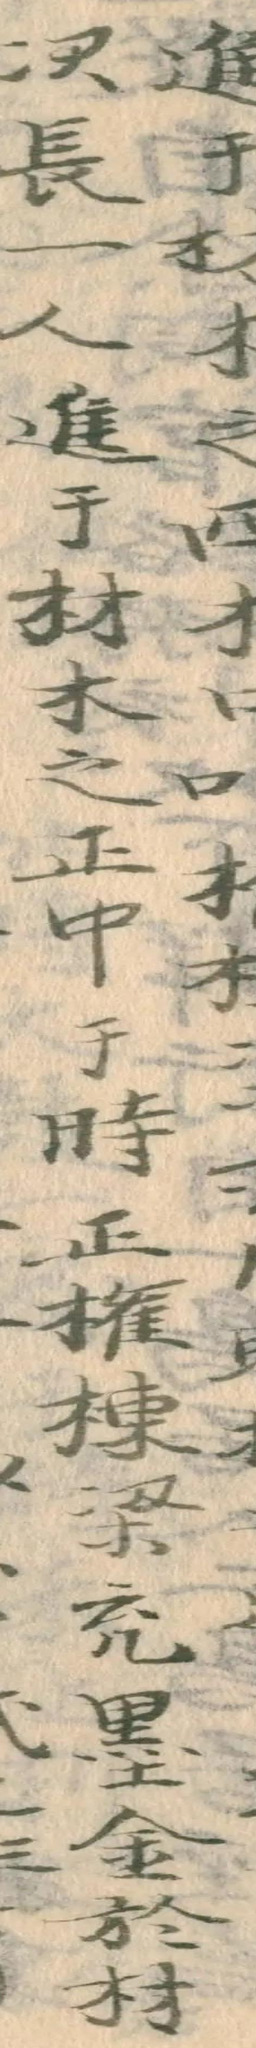次長一人進于材木之正中于時正権棟梁充墨金於材
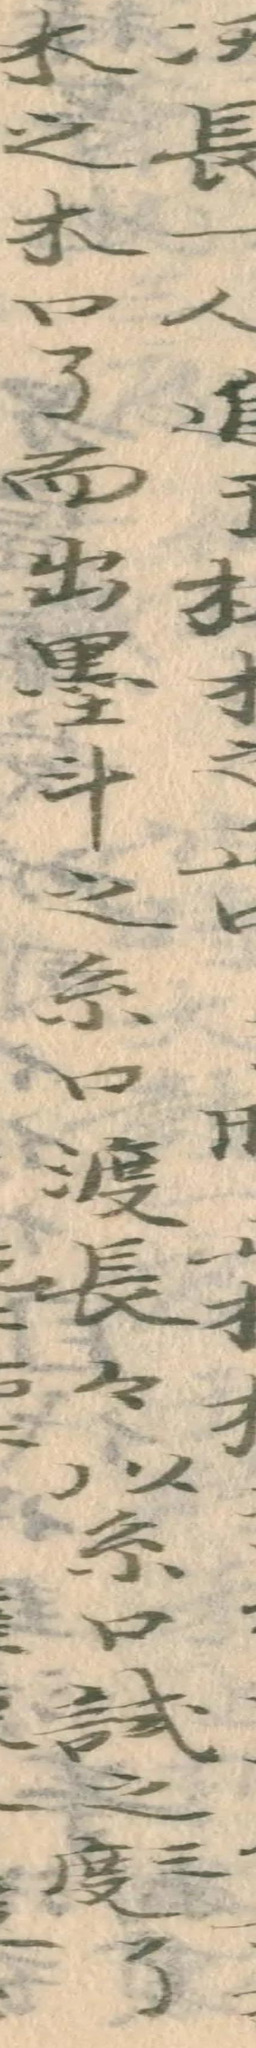木之木口了而出墨斗之糸口渡長々以糸口試之三度了
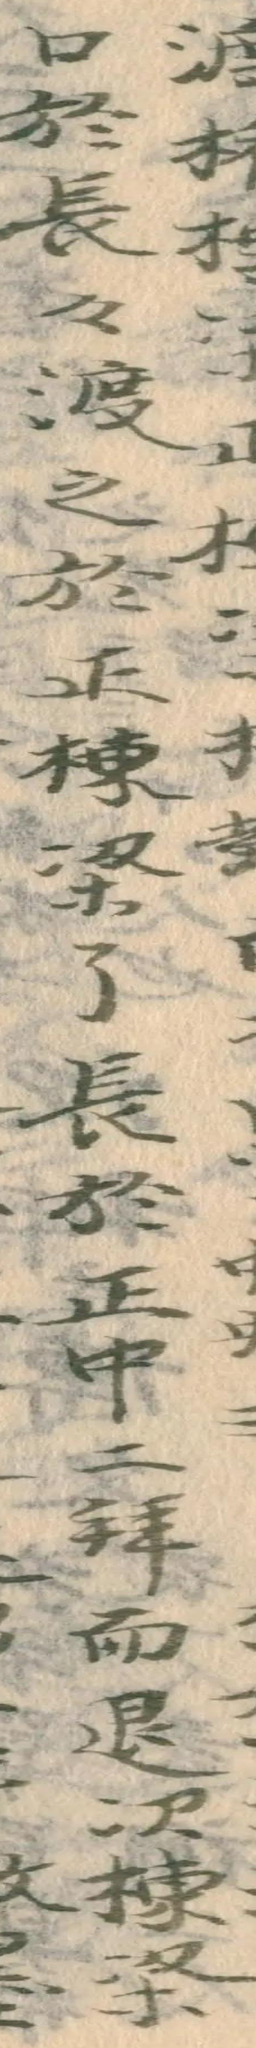口於長々渡之於正棟梁了長於正中二拜而退次棟梁
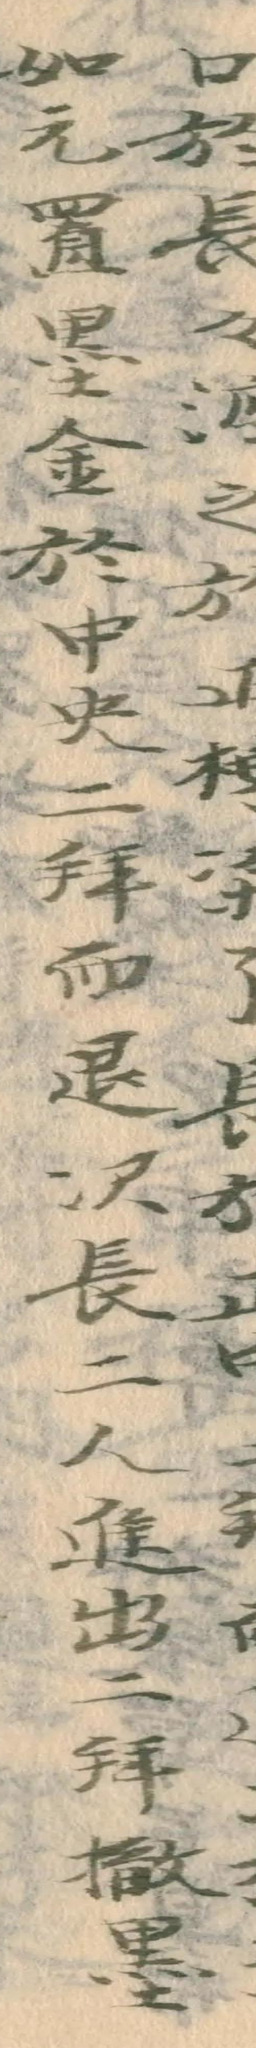如元置墨金於中央二拝而退次長二人進出二拝撤墨
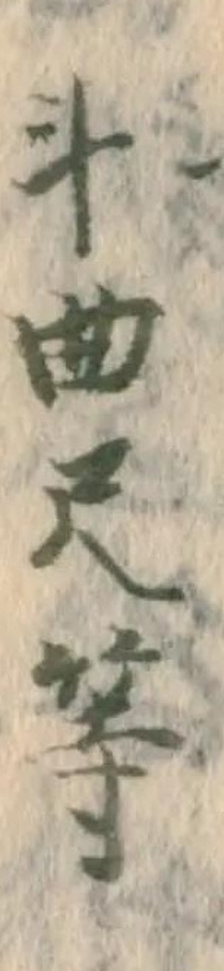斗曲尺等
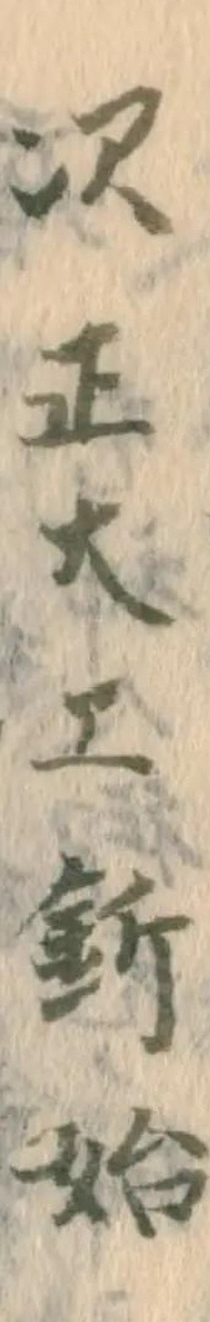次正大工釿始
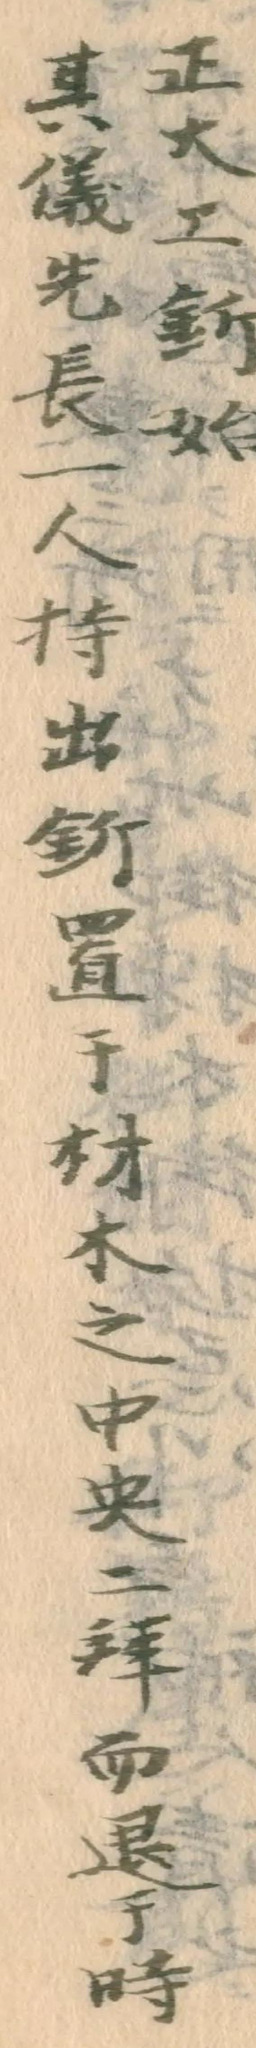其儀先長一人持出釿置于材木之中央二拝而退于時
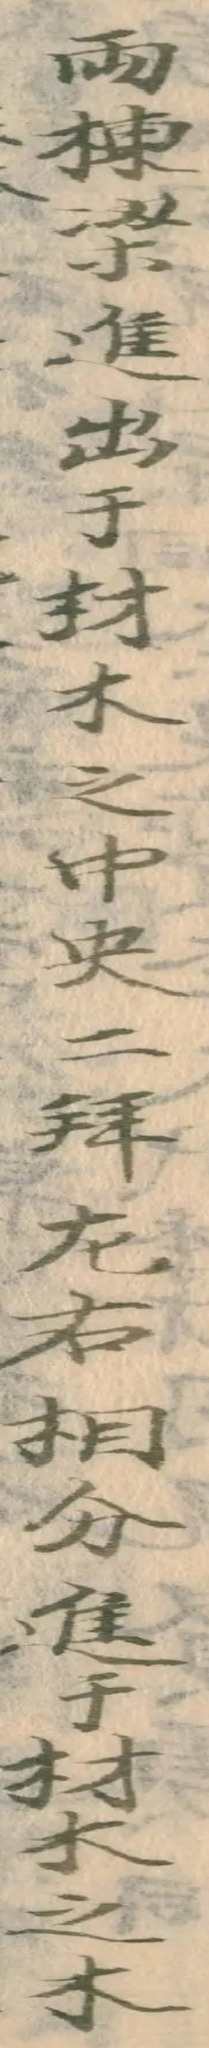両棟梁進出于材木之中央二拝左右相分進于材木之木
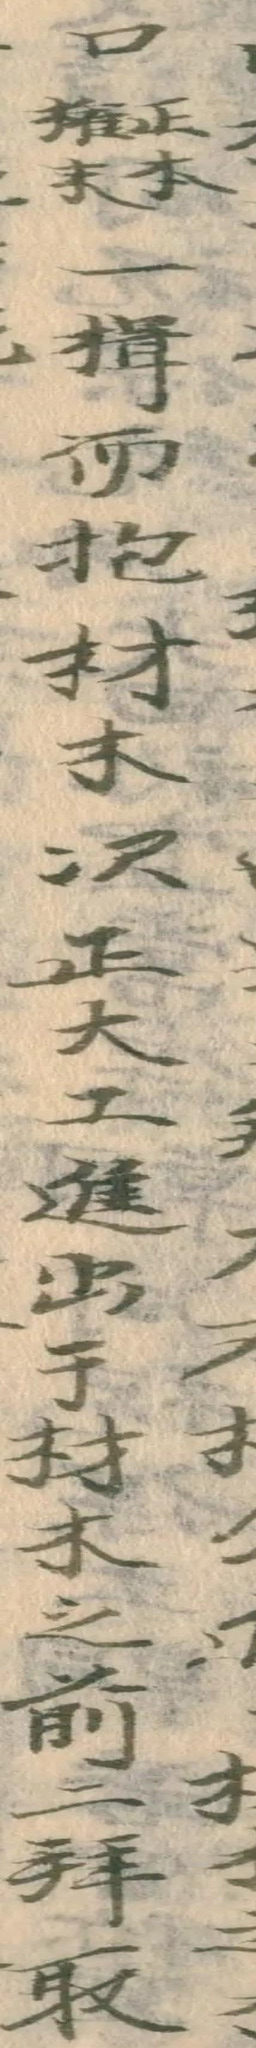口正本権未一揖而抱材木次正大工進出于材木之前二拝取
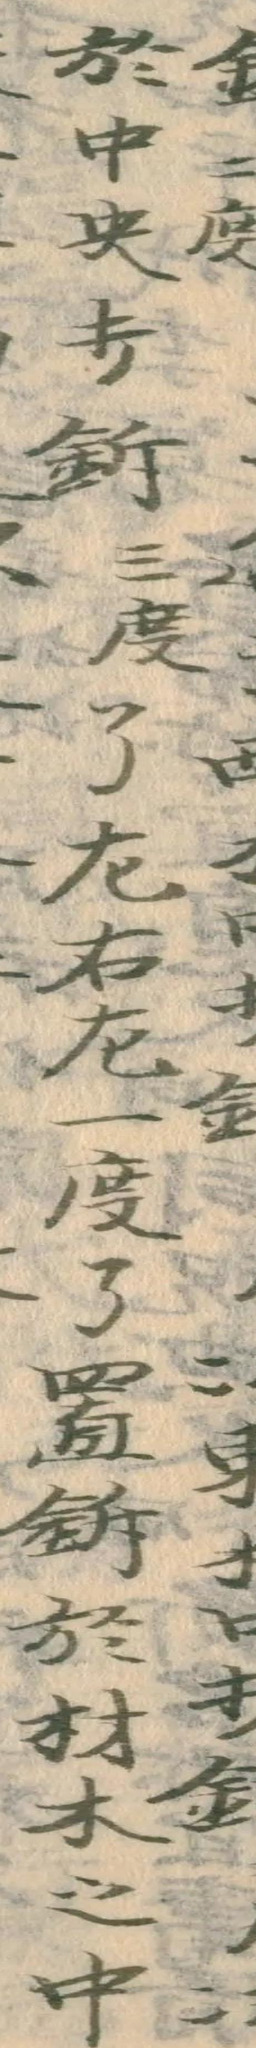於中央打釿三度了左右左一度了置釿於材木之中
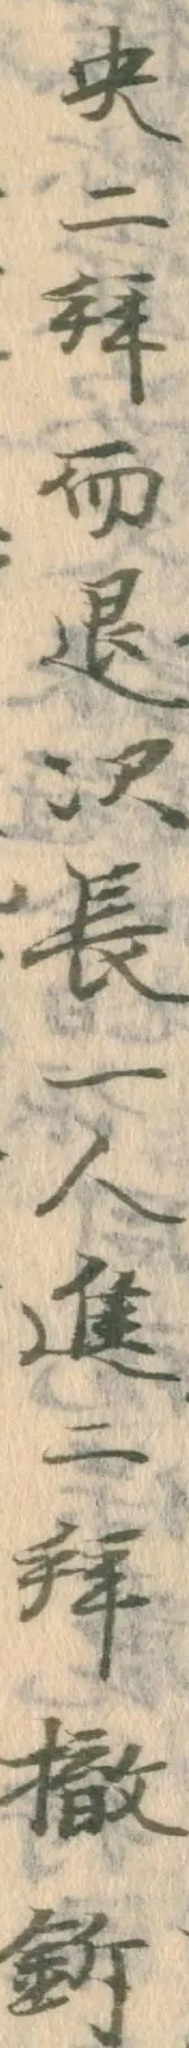央二拝而退次長一人進二拝撤釿
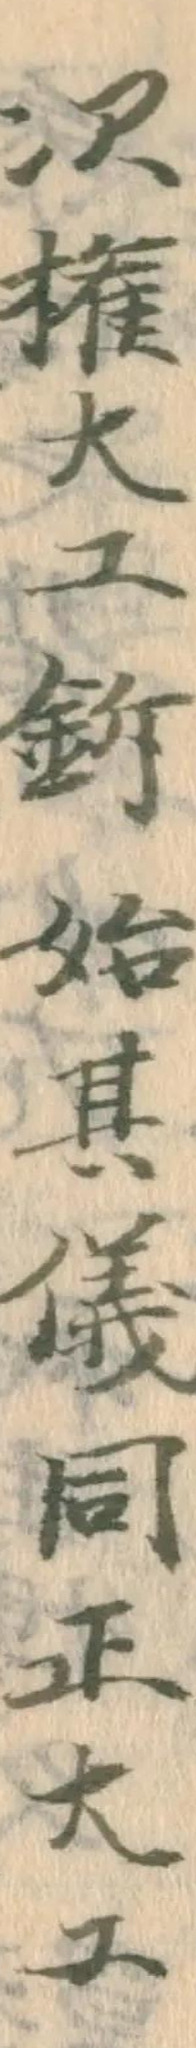次権大工釿始其儀同正大工
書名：賀茂社記録. 第17冊
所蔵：国立国会図書館 National Diet Library, JAPAN
